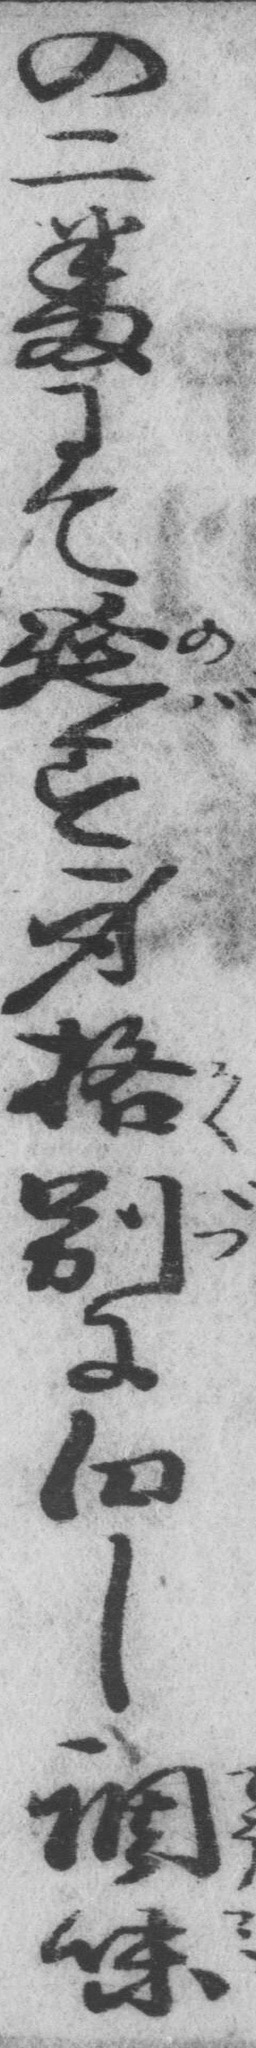の二番にて延す身格別に白し調味
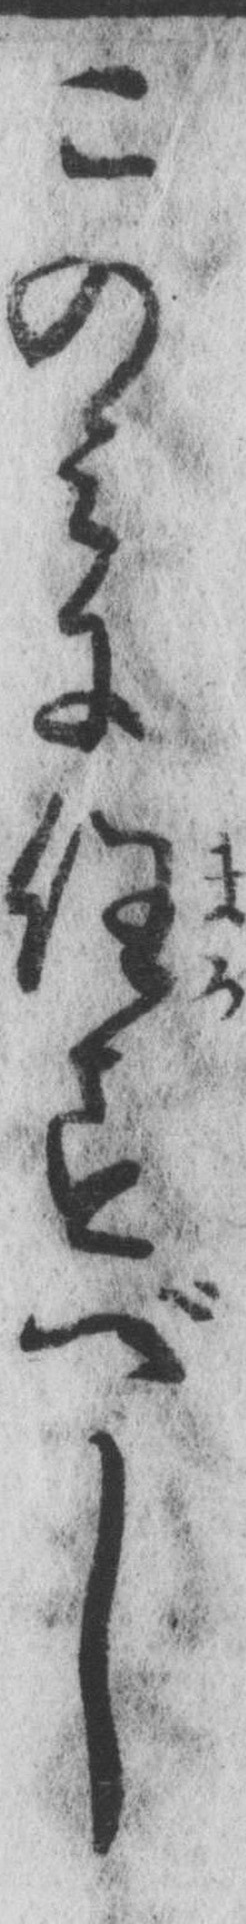このみに任すべし
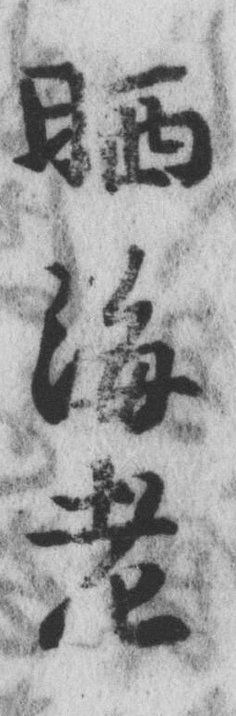晒海老
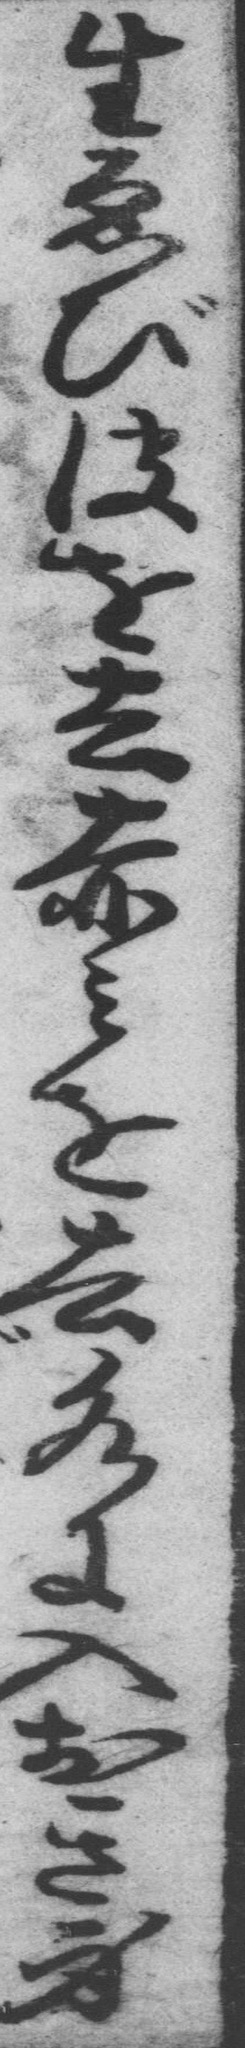生ゑび皮を去赤みを去水に入おき身
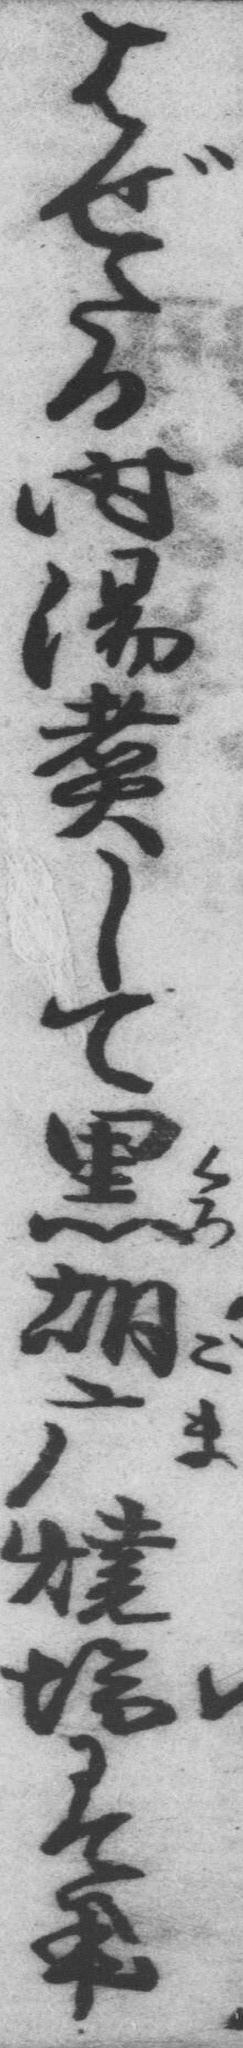はぜたる時湯煮して黒胡麻焼塩にて用
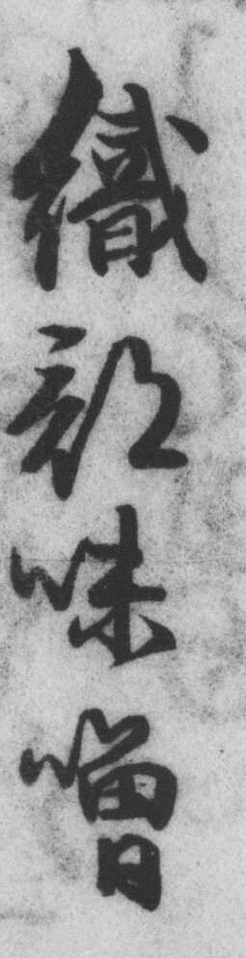織部味噌
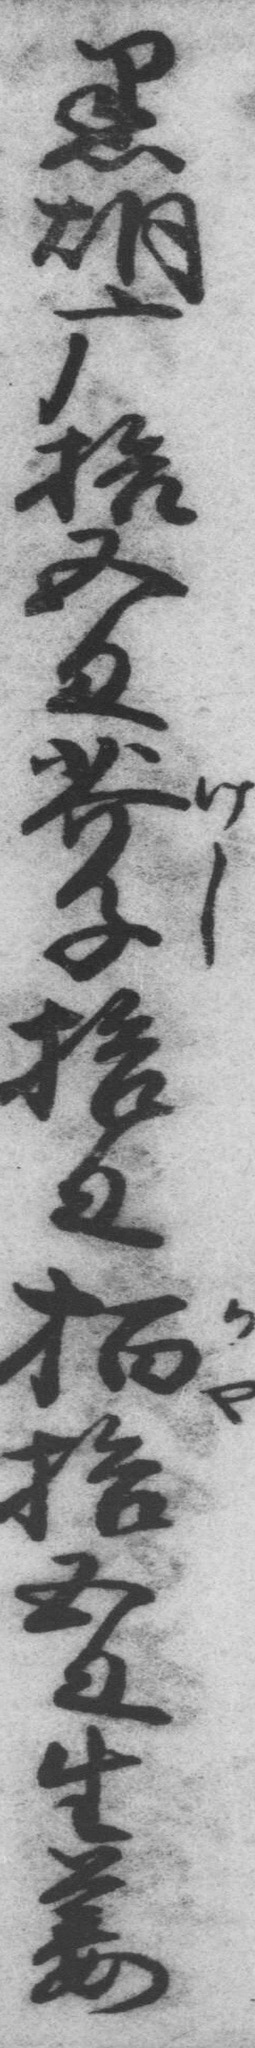黒胡麻拾五匁芥子拾匁栢拾五匁生姜
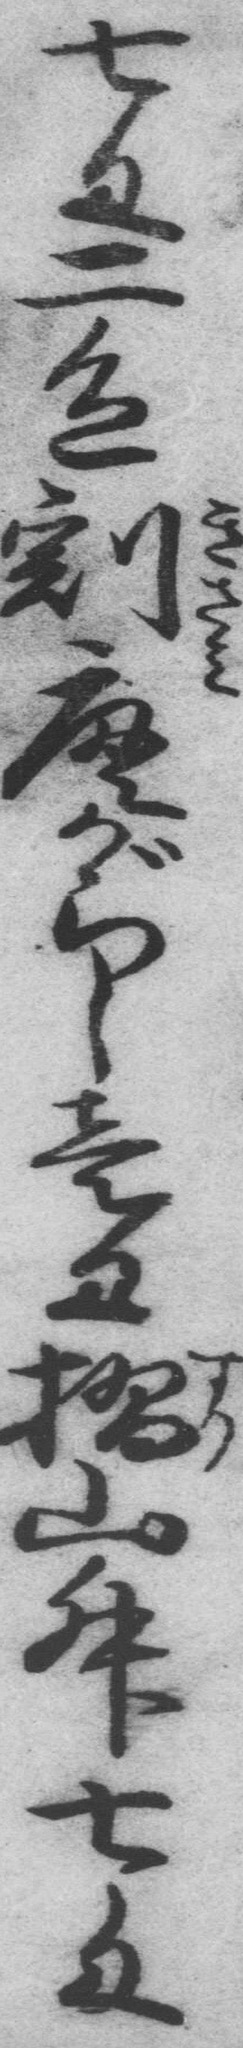七匁二色割唐がらし壱匁摺山升七匁
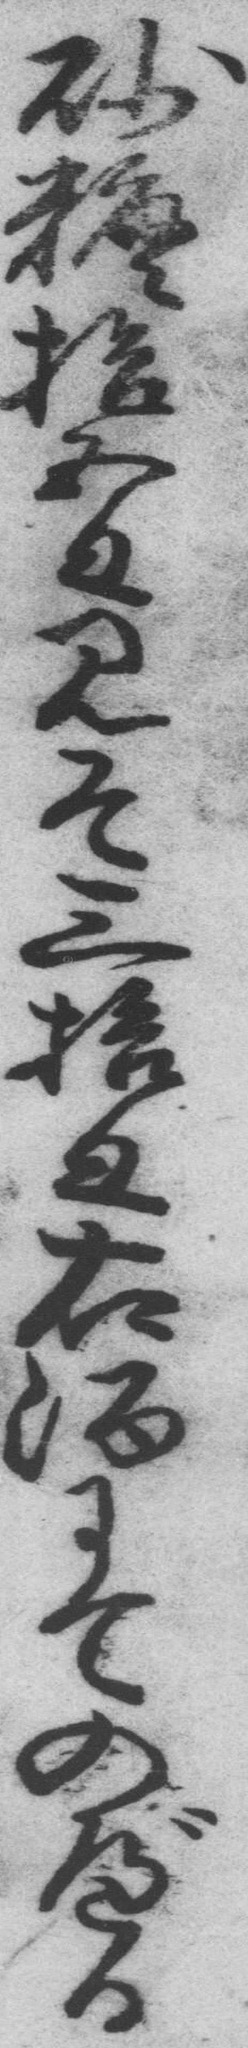砂糖十五匁みそ三拾匁右酒にてのべる
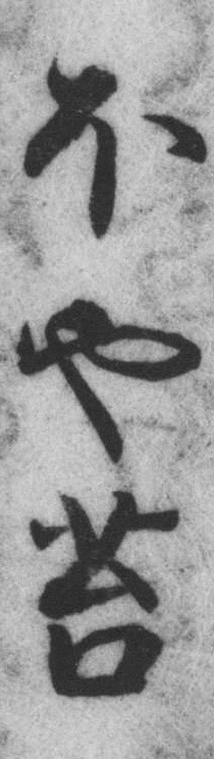ほや苔

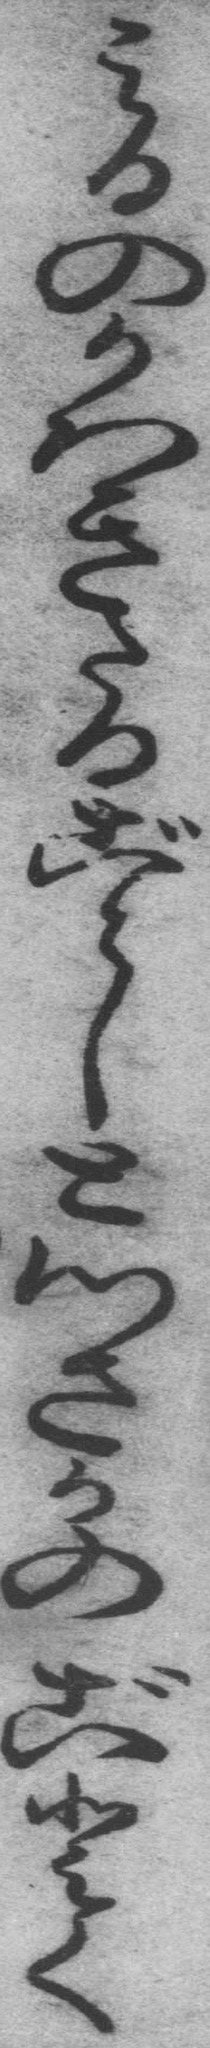みるのかはきたるごとしとつさかのごとく
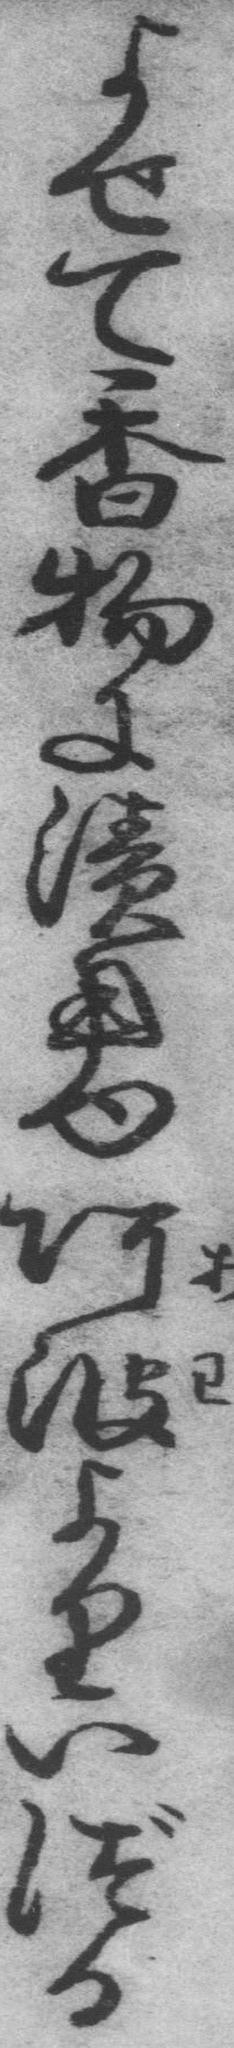よせて香物に漬用ゆ阿波よりいづる
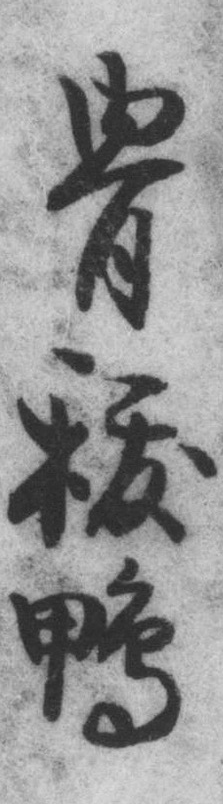骨抜鴨
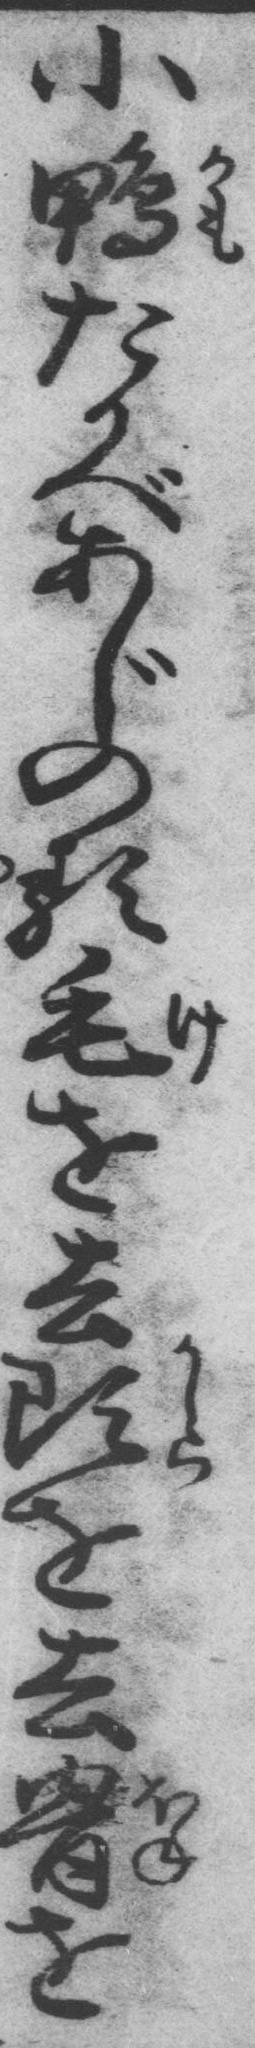小鴨たかべあじの類毛を去頭を去骨を
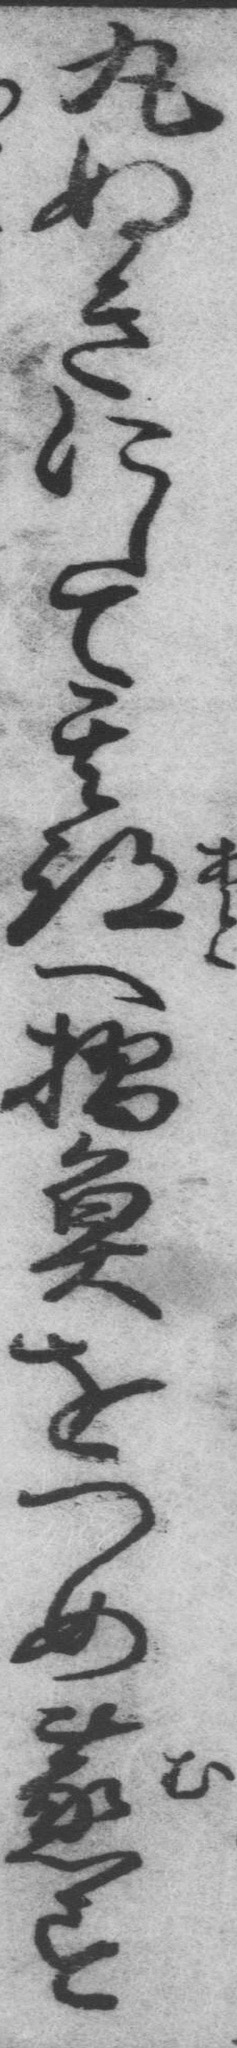丸ぬきにして其跡へ摺魚をつめ蒸す
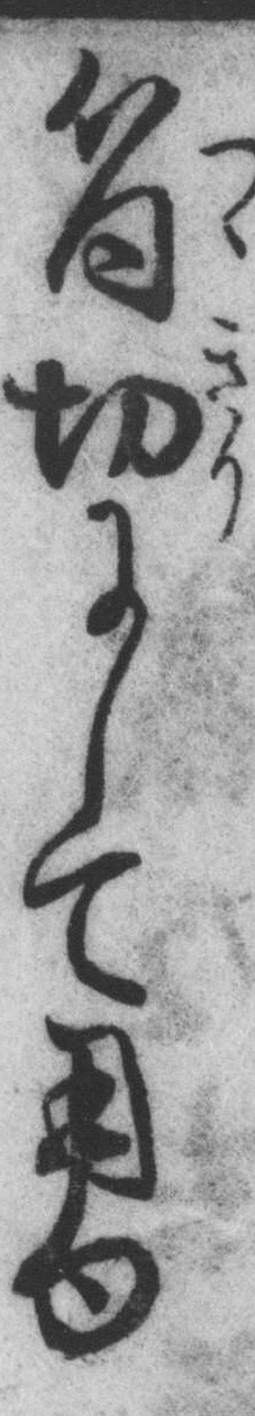筒切にして用ゆ
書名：料理山海郷
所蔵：大阪府立大学学術情報センター 国文学研究資料館
